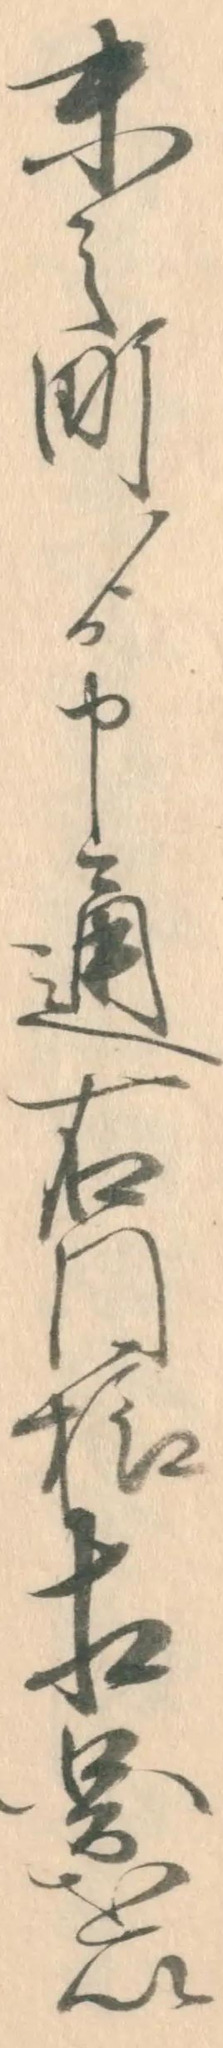末之町ゟ申通右同様相図を以
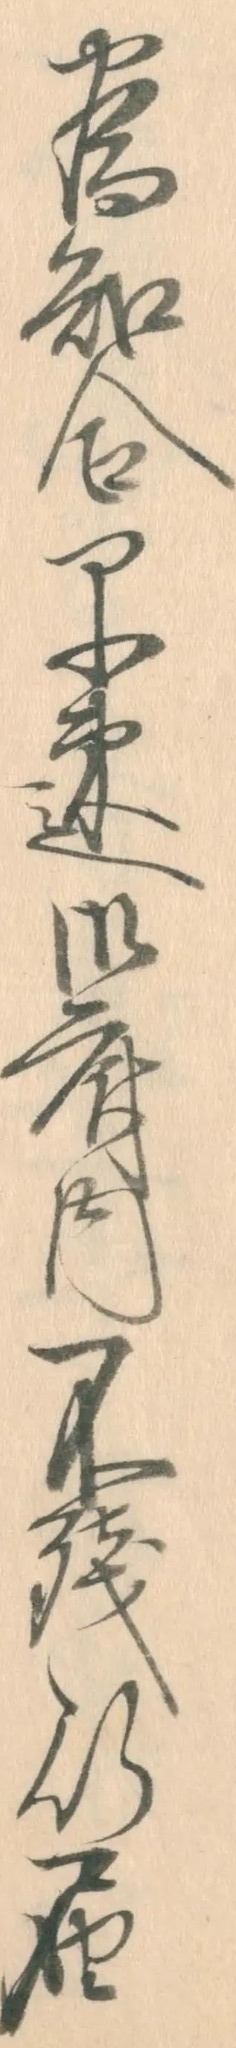為知合早速御府内不残行届
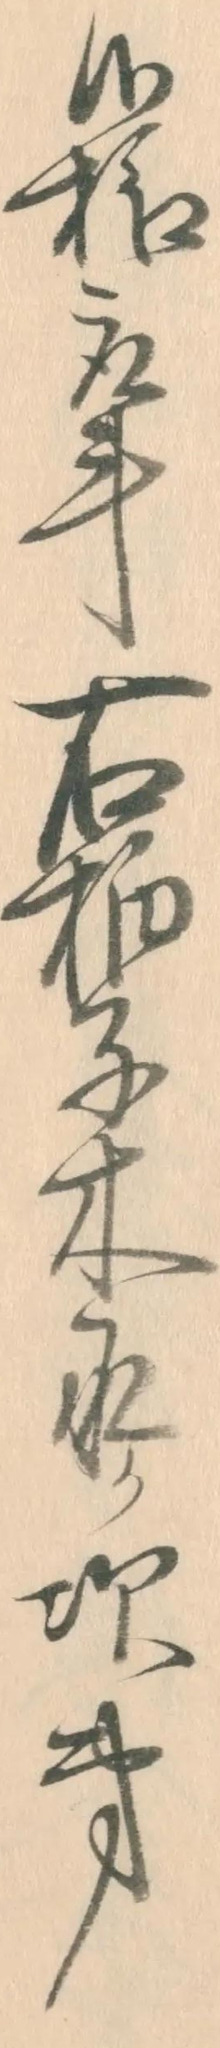候様取計右拍子木承り次第
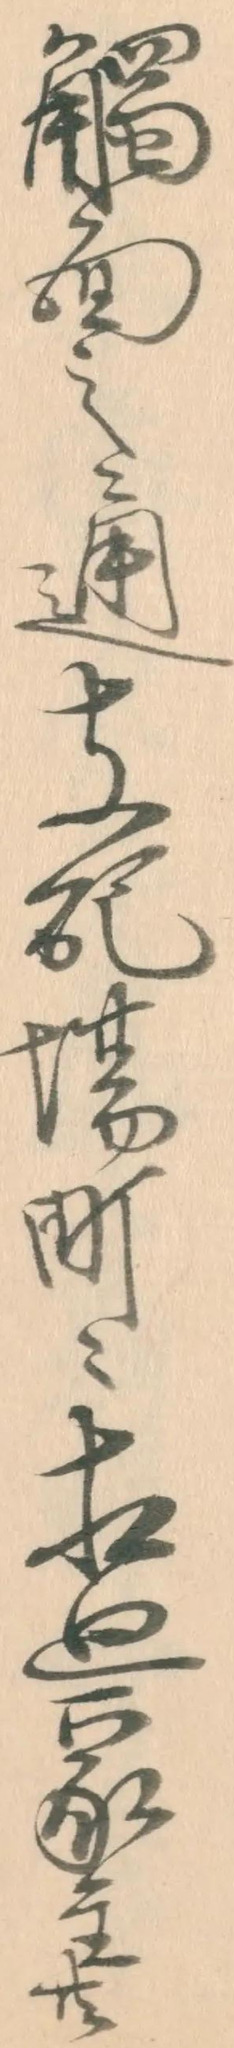触面之通支配場町々相廻家主共
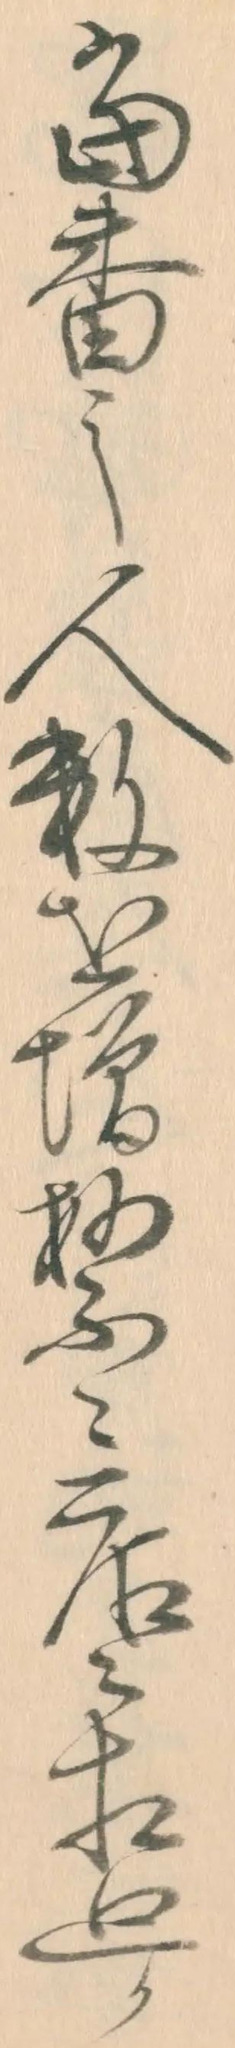当番之人数を増繁々店々相廻り
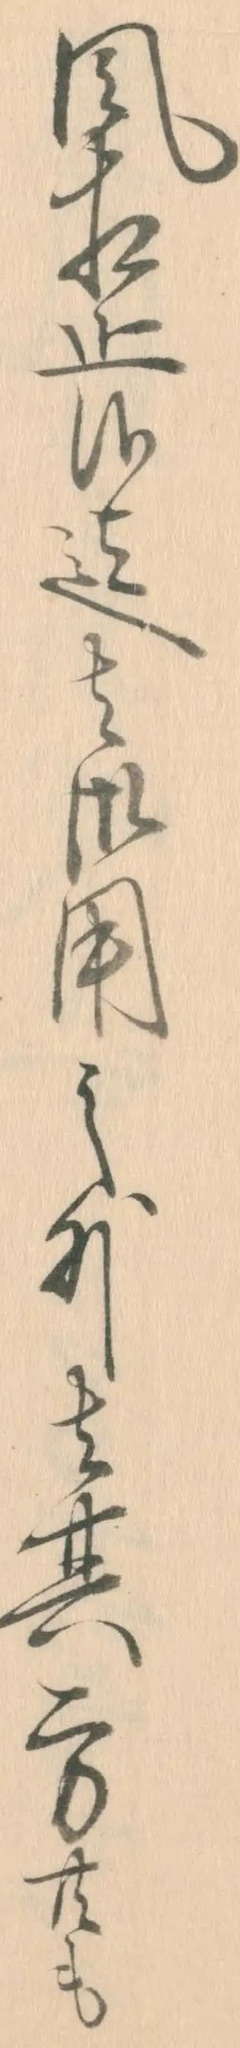風相止候迄は御用之外は其方共も
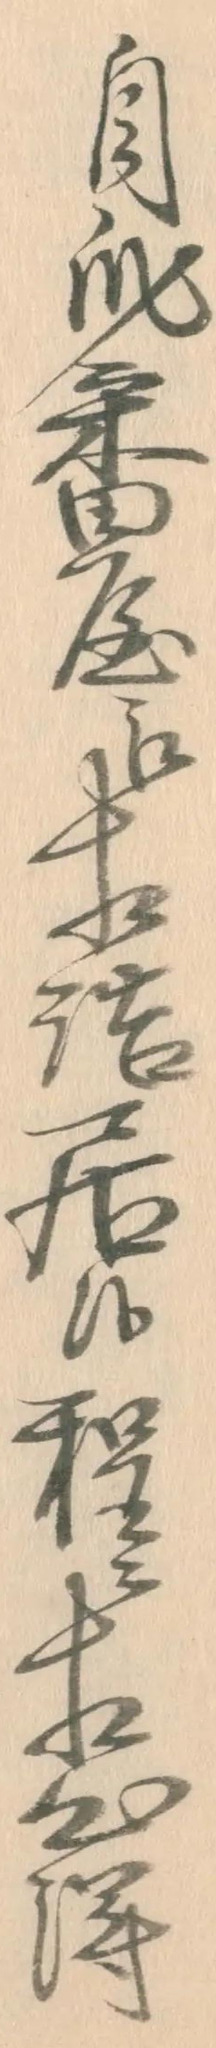自身番屋え相詰居候程ニ相心得
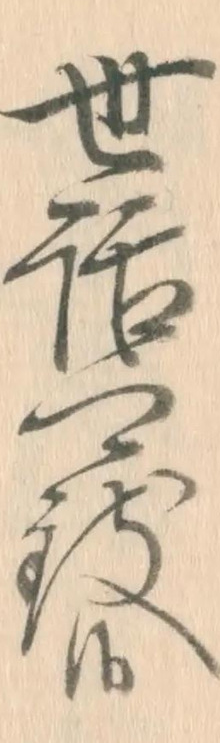世話可致候
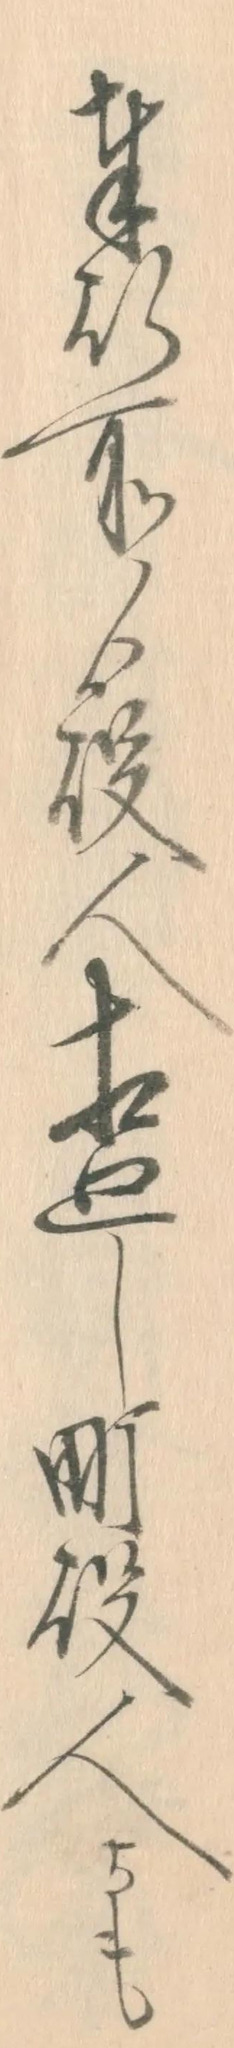一奉行所ゟ役人相廻し町役人とも
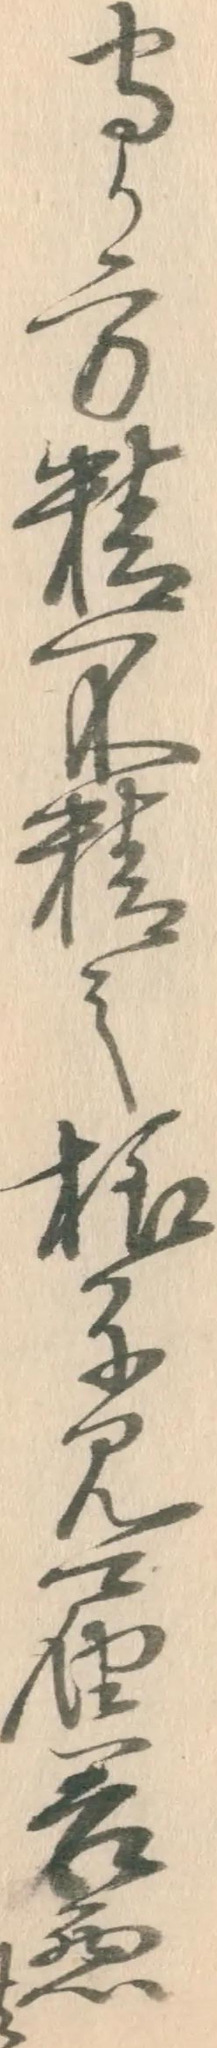守り方精不精之様子見届善悪共
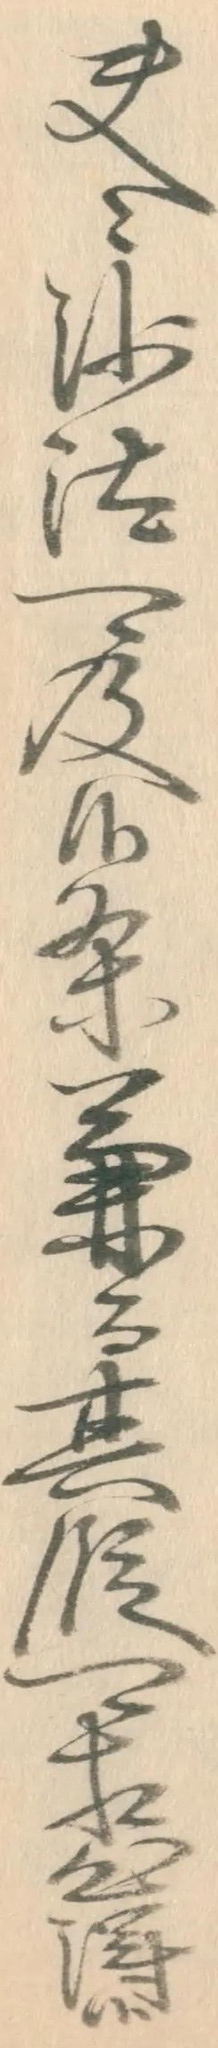夫々沙汰可及候条兼而其段可相心得候

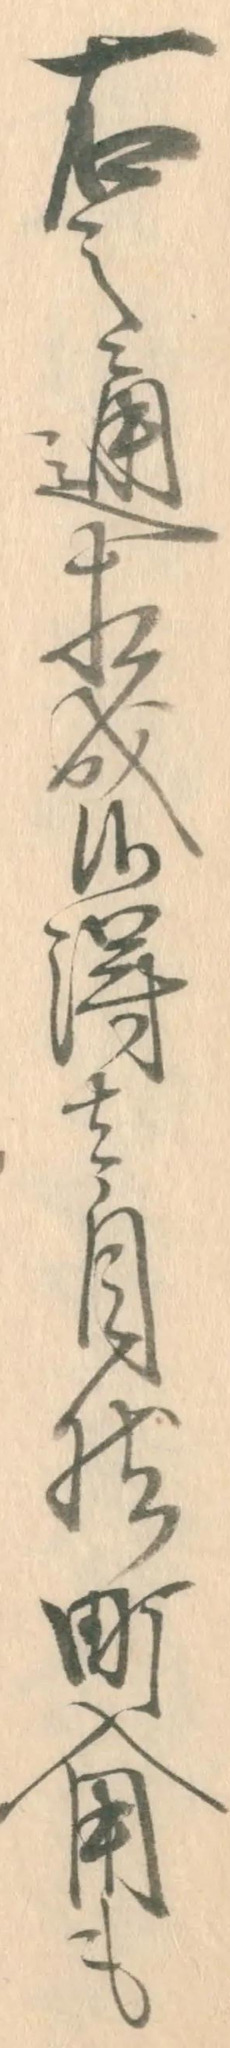右之通相成候得は自然町入用も
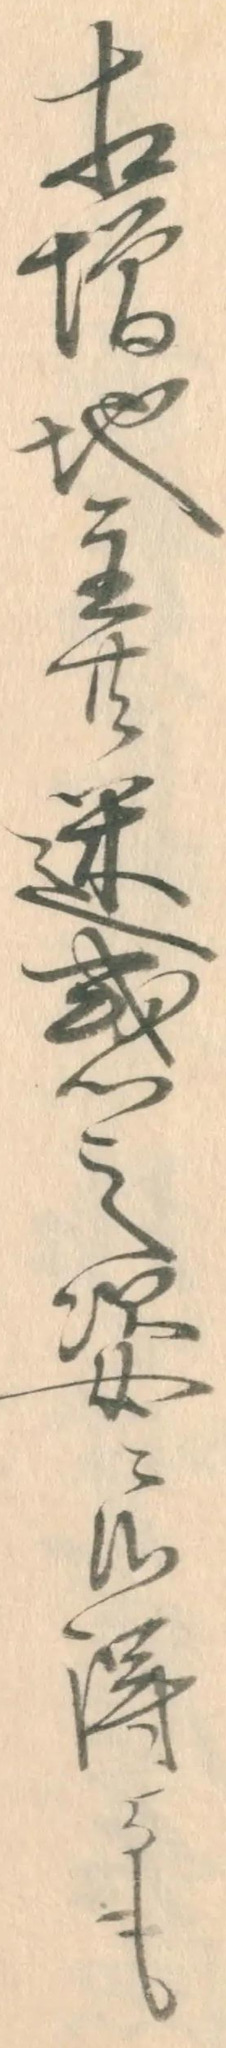相増地主共迷惑之姿ニ心得とも
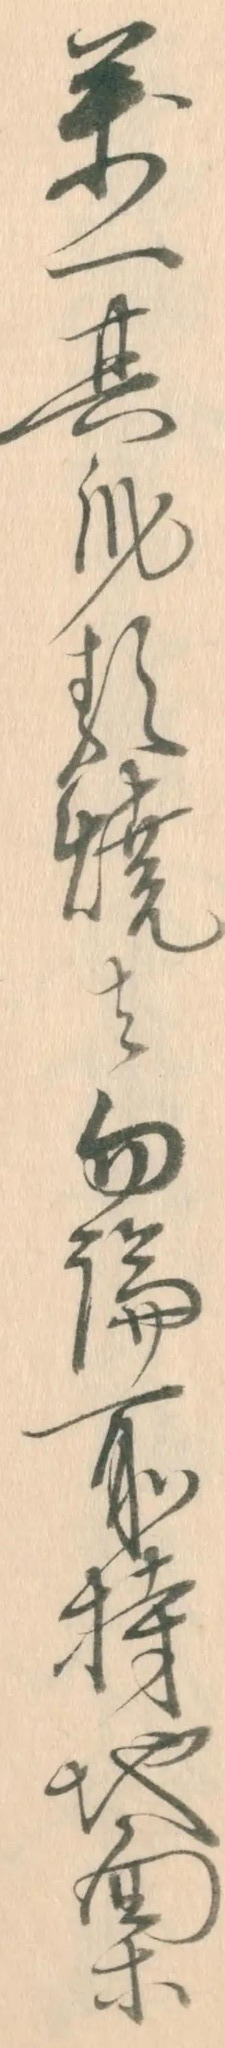万一其身類焼は勿論所持地面等
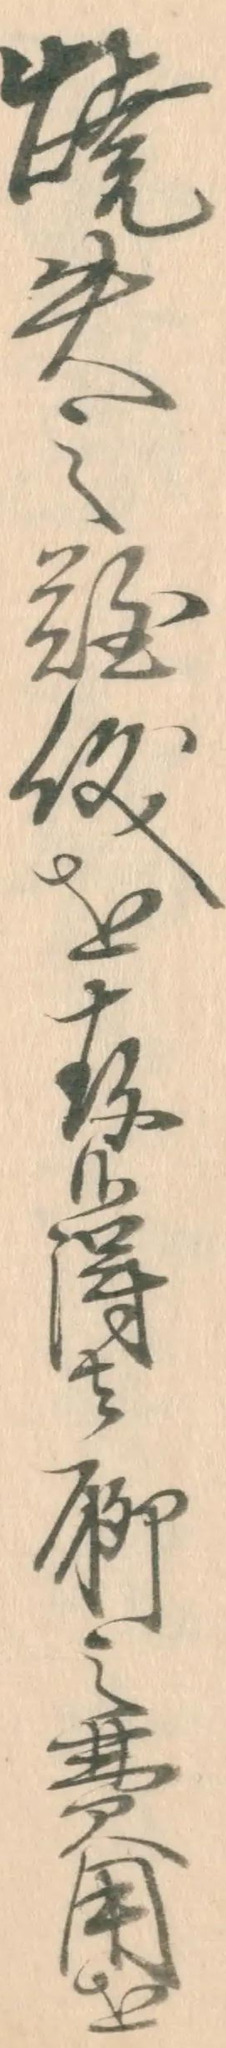焼失之難儀を存候得は聊之費用を
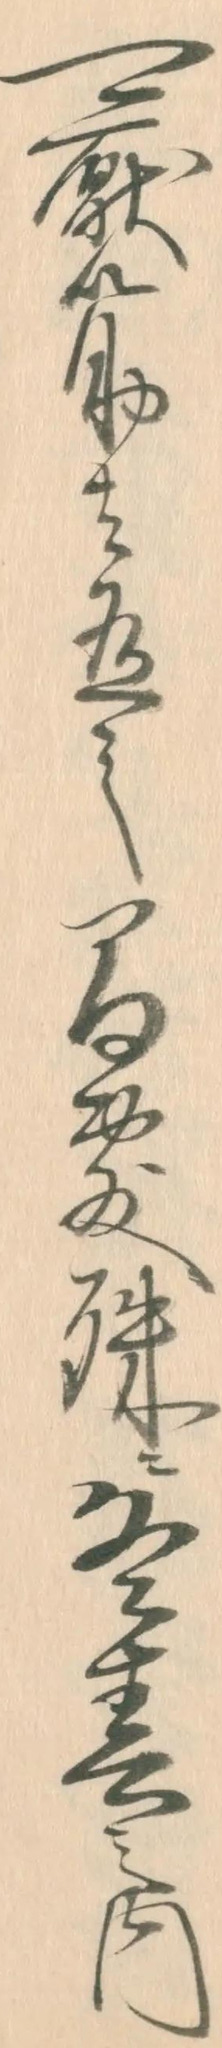可厭筋は有之間敷殊ニ冬春之内
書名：三橋 17巻. [7] 三橋小破御修復書留　但御奉行御掛リ替地震潰橋番屋　嘉永四亥年より安政二卯年迄　上
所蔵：国立国会図書館 National Diet Library, JAPAN
